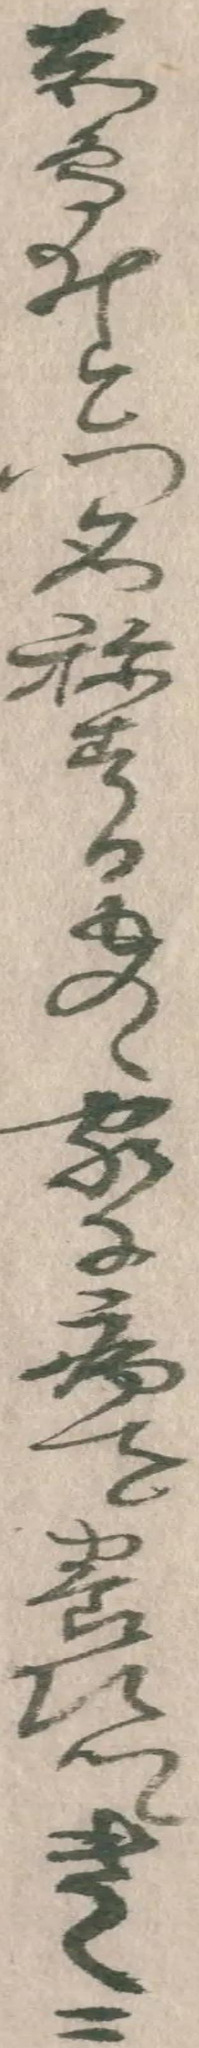東鳥井と門名称するものゝ家に病を養ひつゝきくに
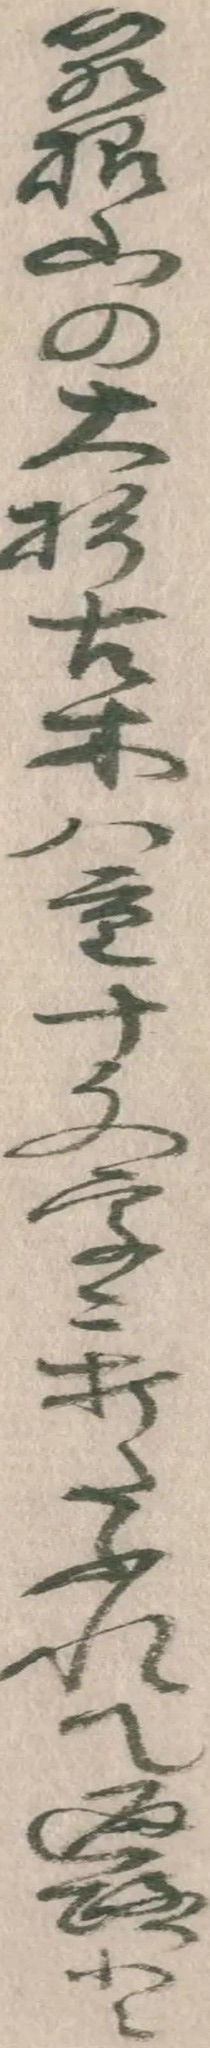箱根山の大杉古木八重十文字に折たふれて通路と
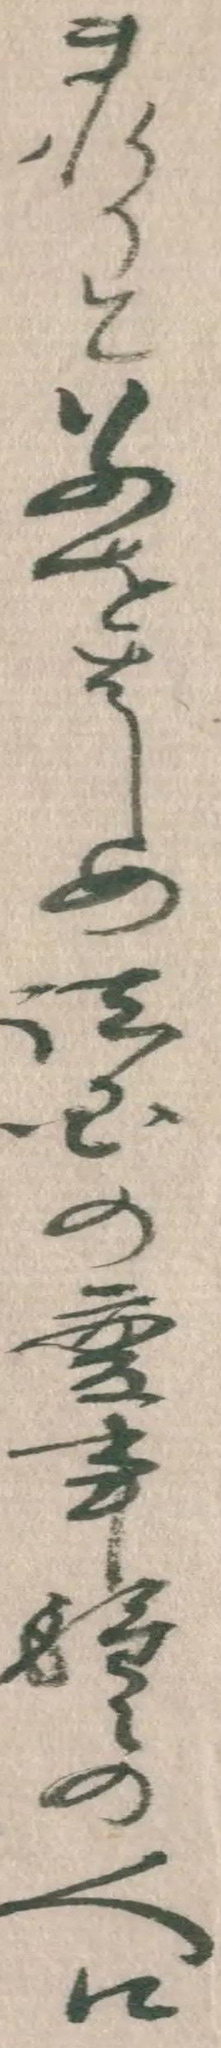まれりといふをはしめ諸国の変事種々の人に
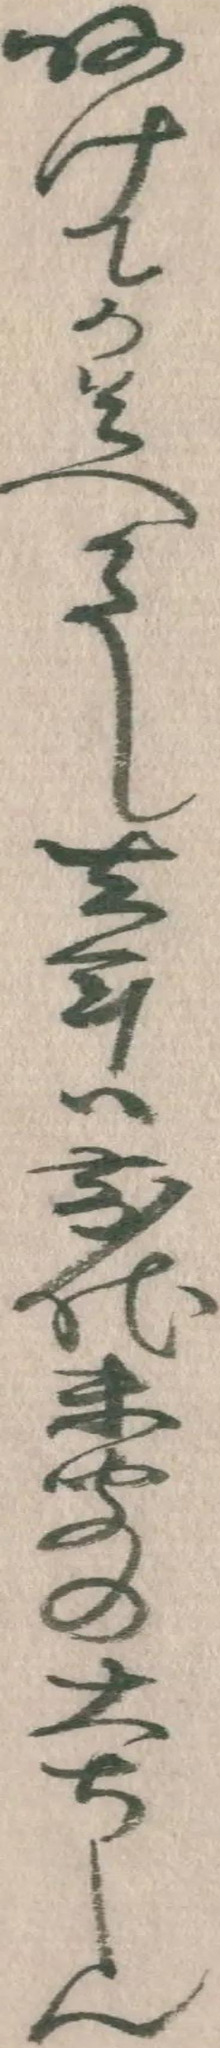あけてかそへかたし去年は前代未聞の大ちしん
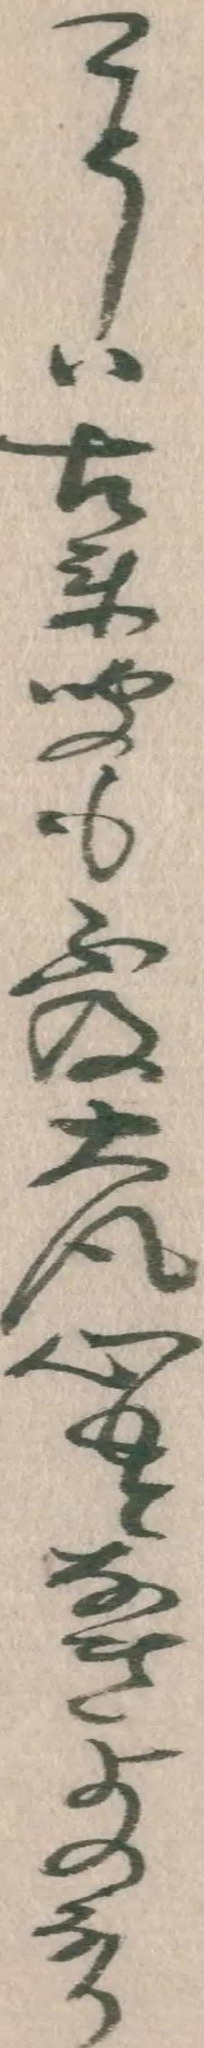ことしは古来聞も不及大風心もとなきよのなり
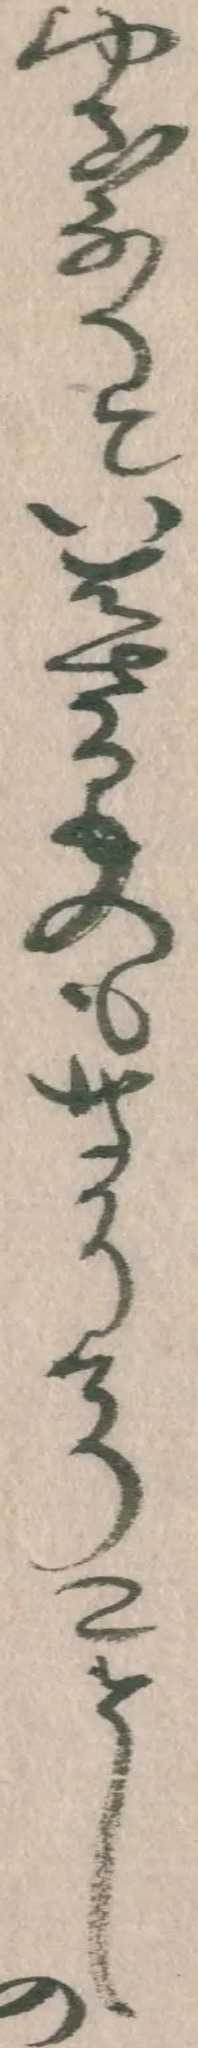ゆきなりといはさるものもなかりけりことしの
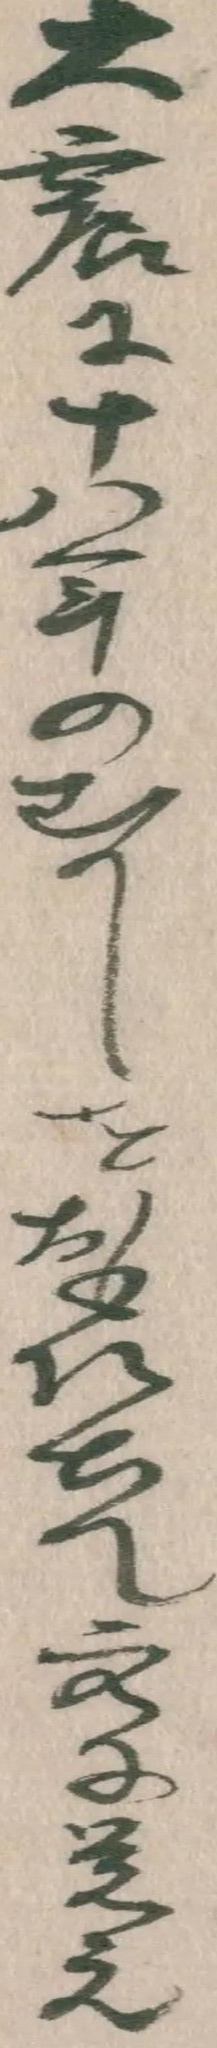大震に十八年のむかしをおもひ出て空に覚え
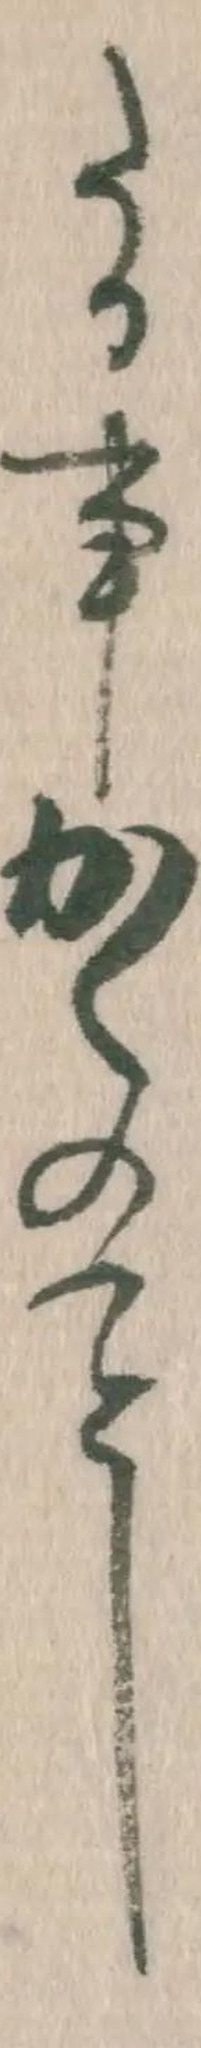たる事かくのことし
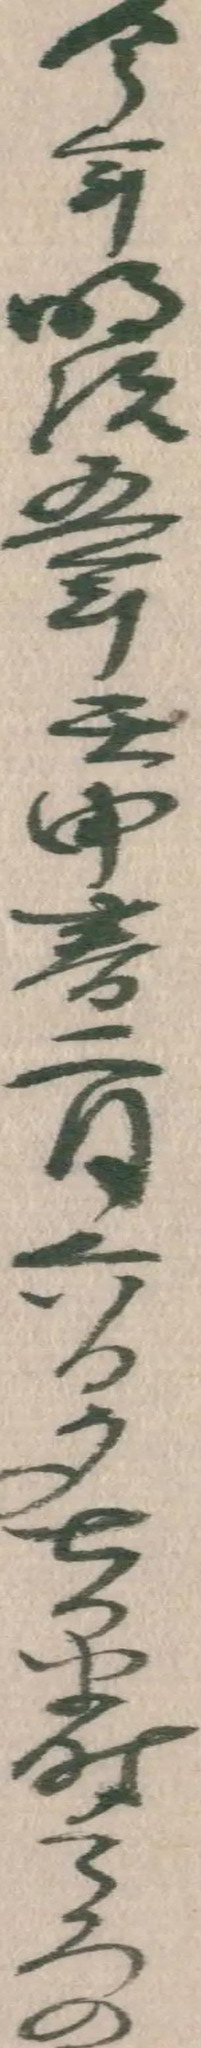今年明治五年壬申春二月六日夕七つ半時ころの
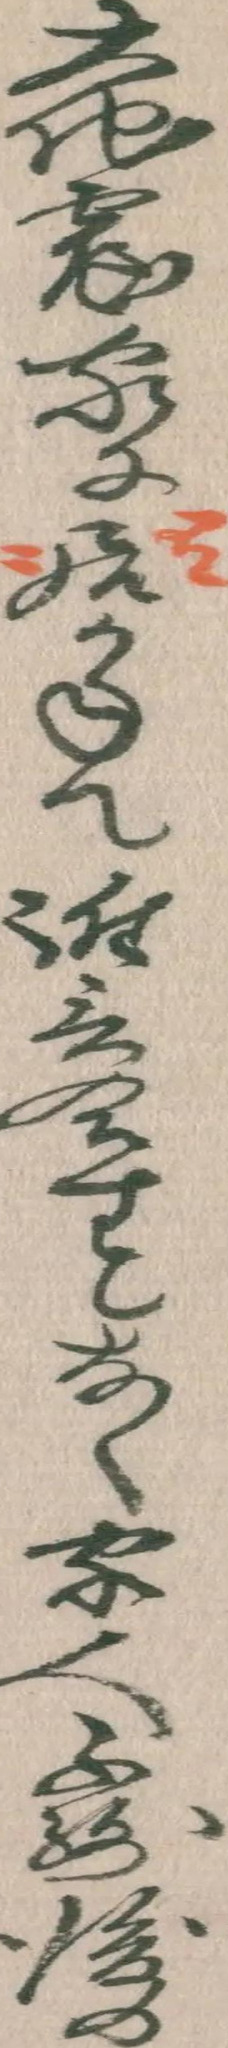大地震家に居かねて誰言合すとなく家人不残後の
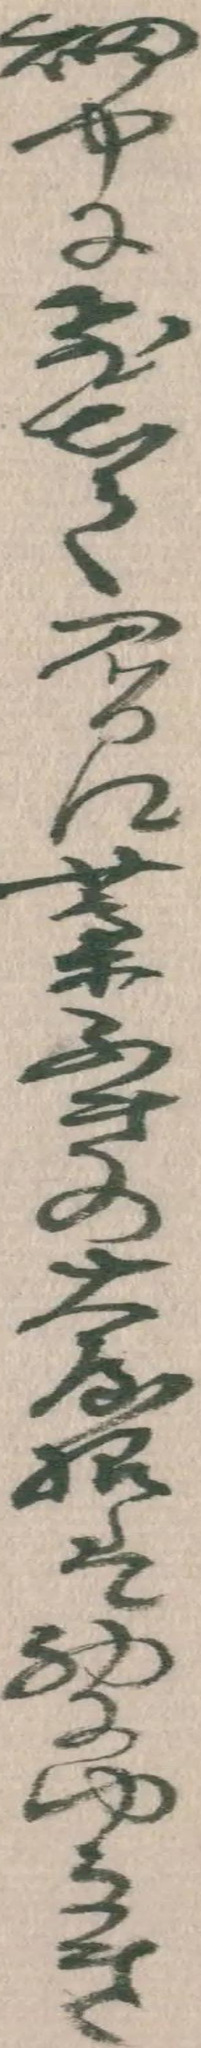畑中に飛出て見るに藁ふきの大家根は初にゆらき
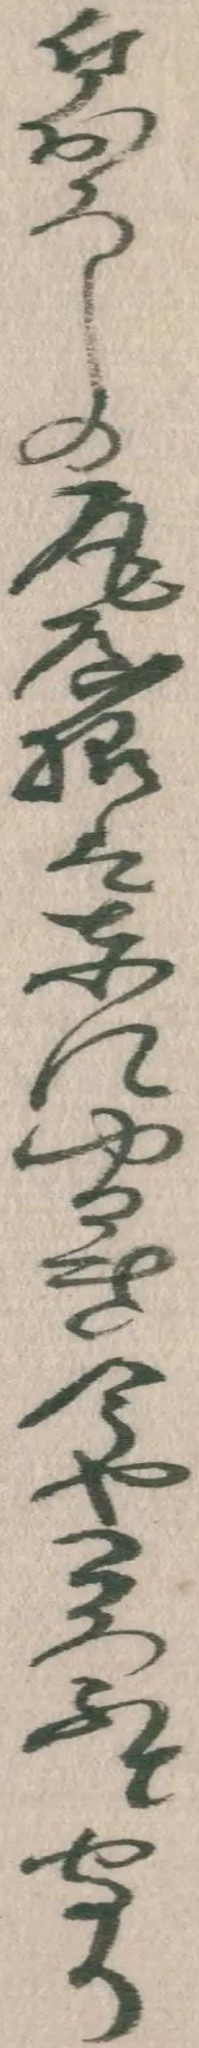付おろしの瓦屋根は東にゆるき今やころふと守り
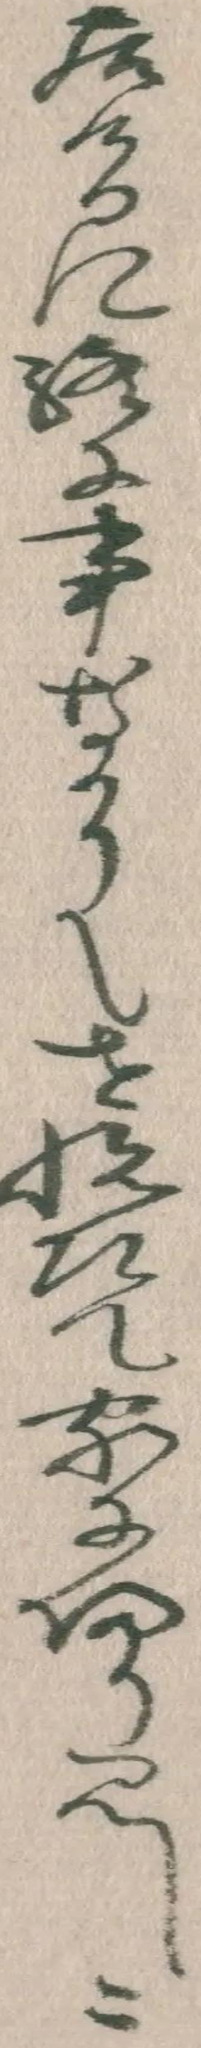居けるに終に事なかりしを悦たて家に帰り見しに
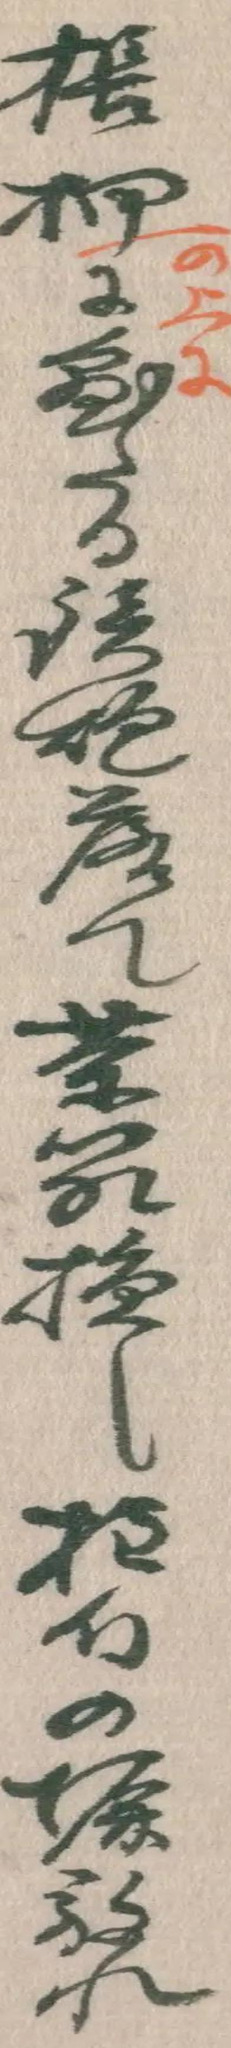棖押の上に懸たる鉄砲落て茶箱損し柱付の塀放れ
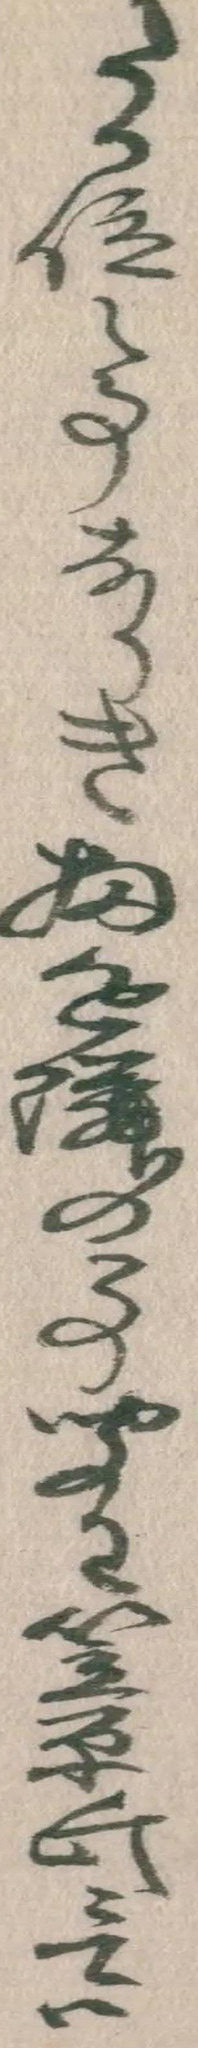たり位之事なりき扨近隣の事聞に笠原氏にては
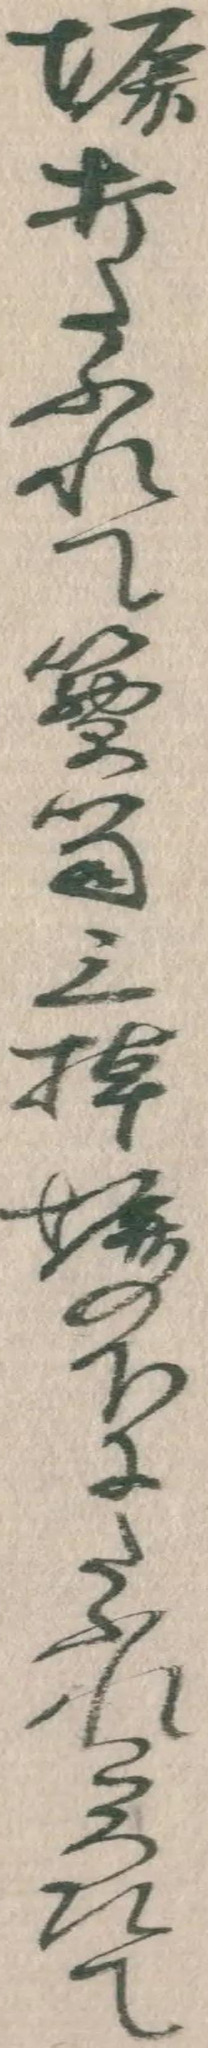塀打たふれて箪笥三棹塀の下にたふれころひて
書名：出雲紀行. 20
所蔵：国立国会図書館 National Diet Library, JAPAN
